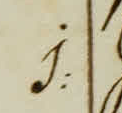1:
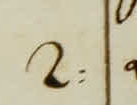2:
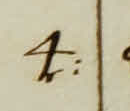4:
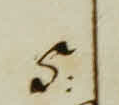5:
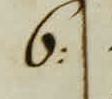6:
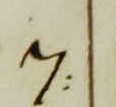7:
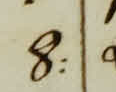8:
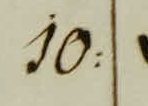10:
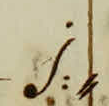1:
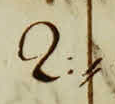2:
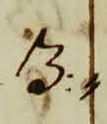3:
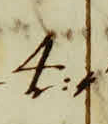4:
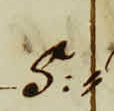5:
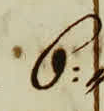6:
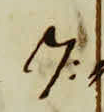7:
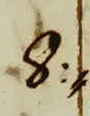8:
